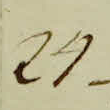24
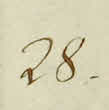28
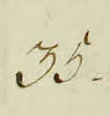35
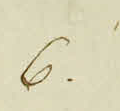6.
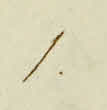1.
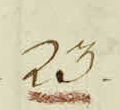23
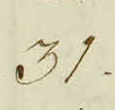31
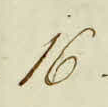16
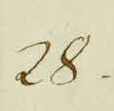28
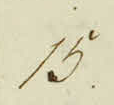15
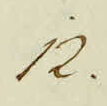12
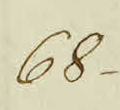68
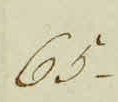65
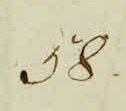58
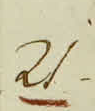21
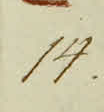14
